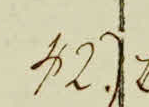42.
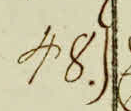48.
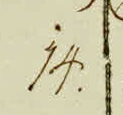14.
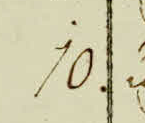10.
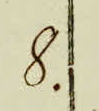8.
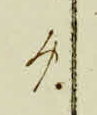4.
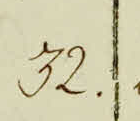32.
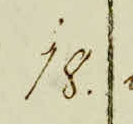18.
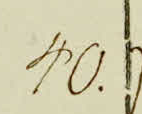40.
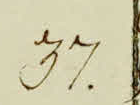37.
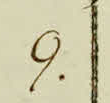9.
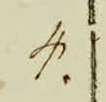4.
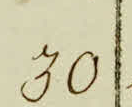30
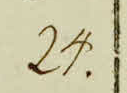24.
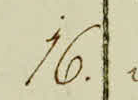16.
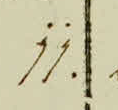11.
